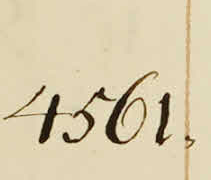4561
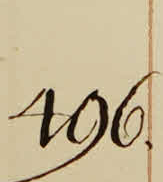496.
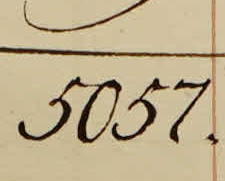5057
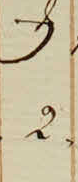2
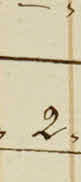2
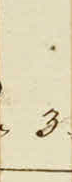3
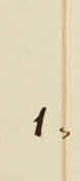1
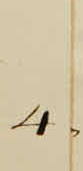4
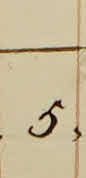5
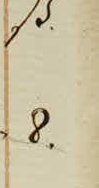8.
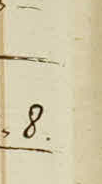8.
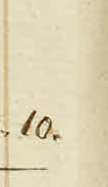10.
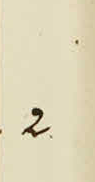2.
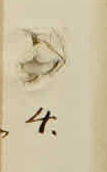4.
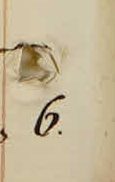6.
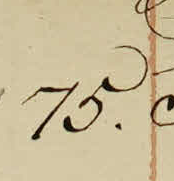75.
